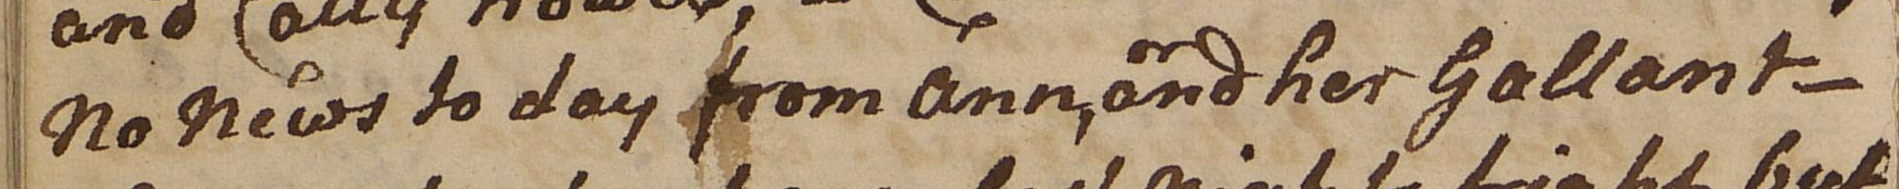no news to day from Ann, and her Gallant-
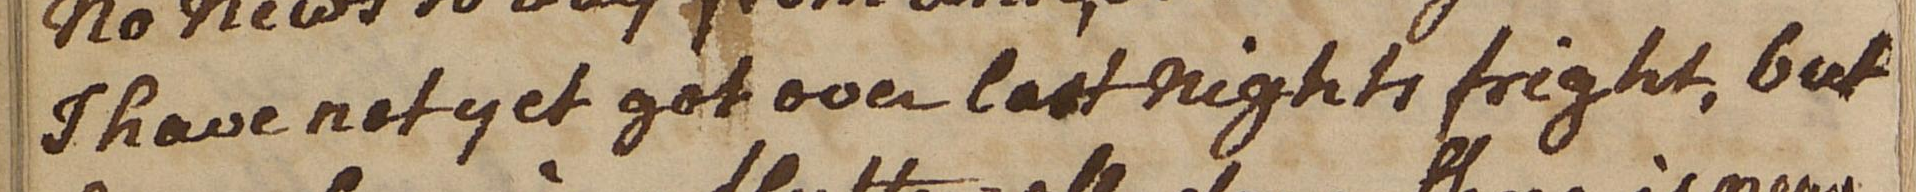I have not yet got over last nights fright, but
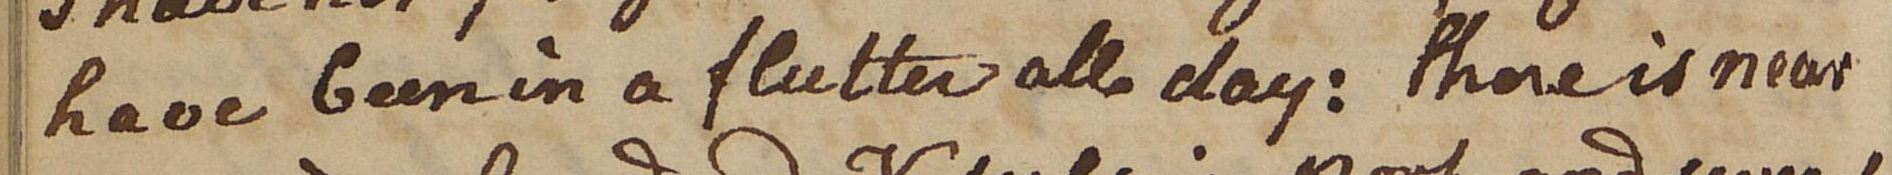have been in a flutter all day: there is near
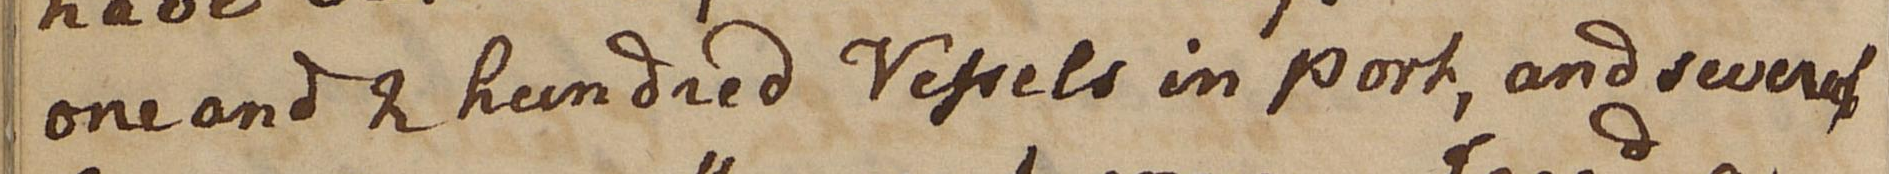one and 2 hundred Vessels in port, and several
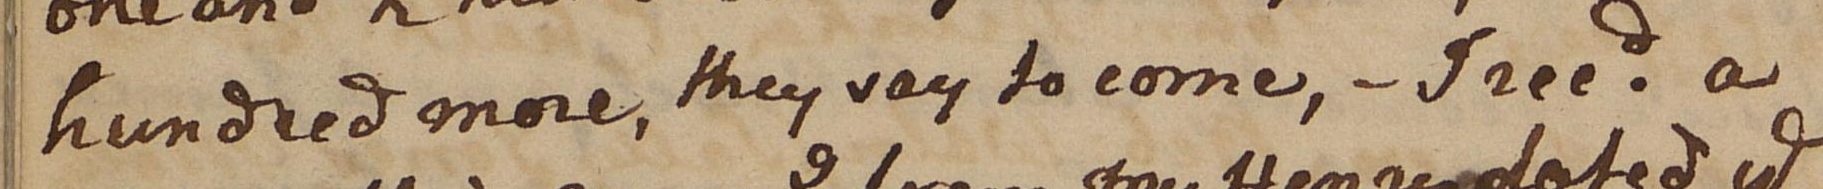hundred more, they say to come,- I rec^d. a
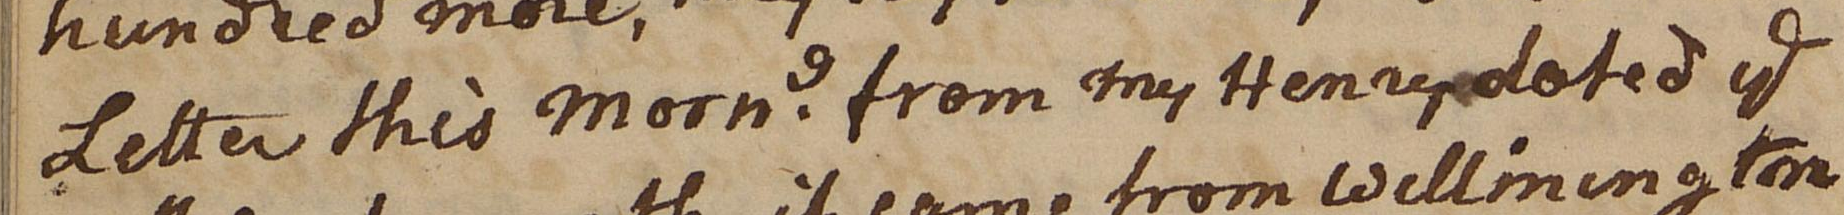Letter this morn^g. from my Henry dated y^e
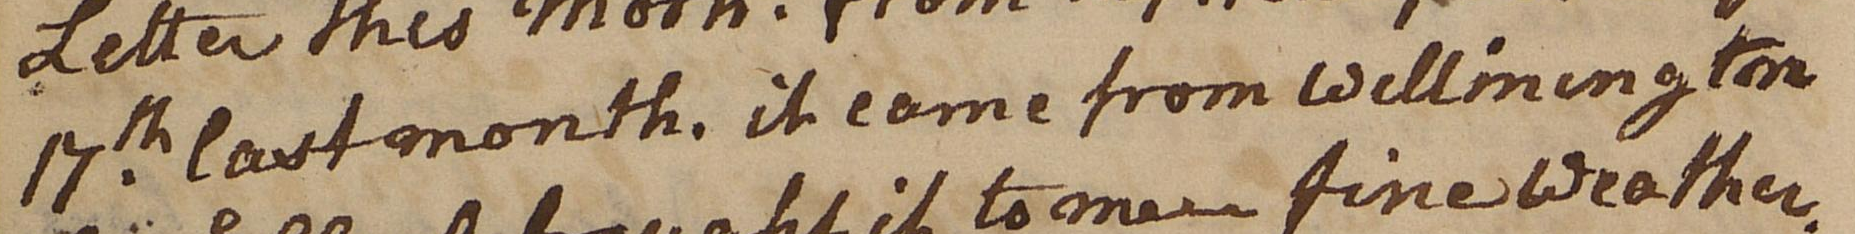17^th. last month, it came from Willmington
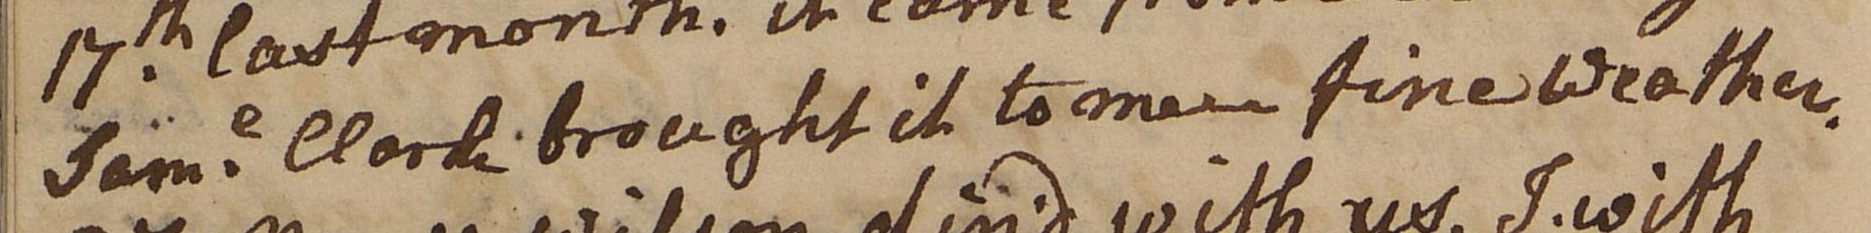Sam^l. Clark brought it to men fine weather,
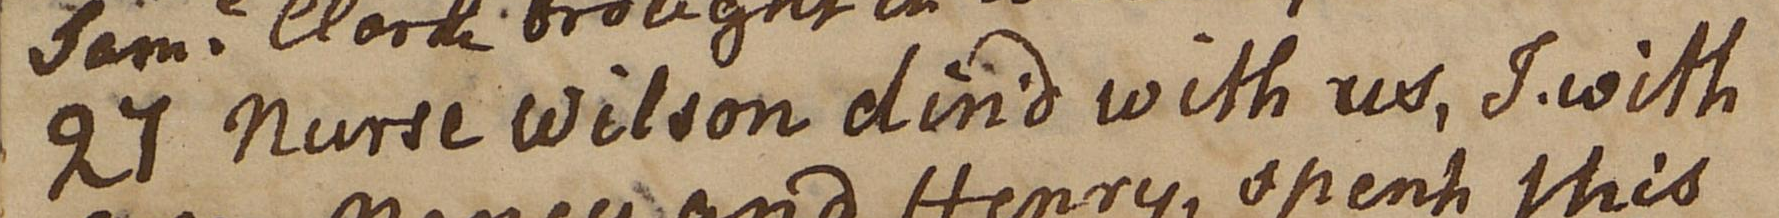27 Nurse Wilson din'd with us, I with
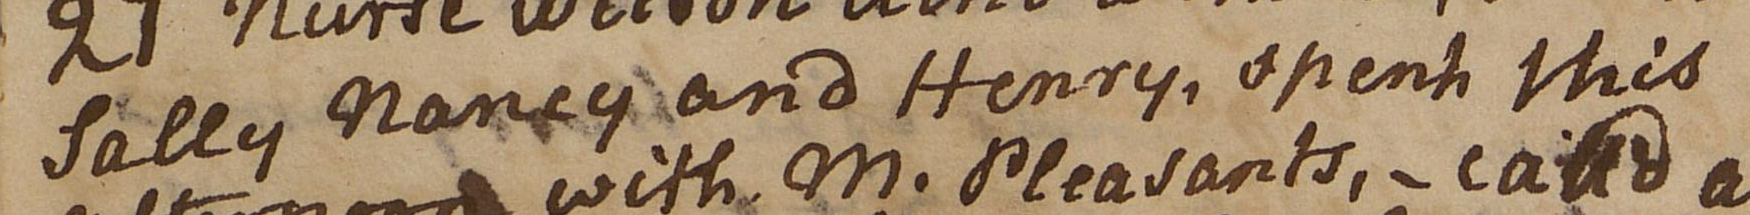Sally Nancy and Henry, spent this
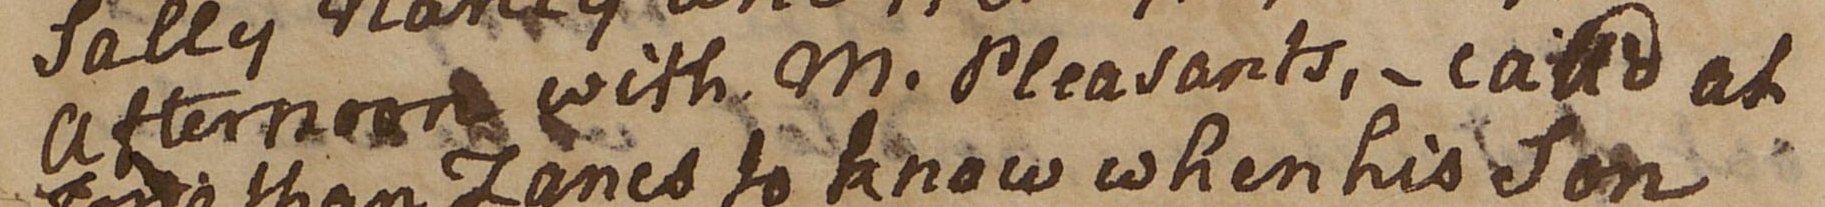Afternoon with M. Pleasants,- call'd at
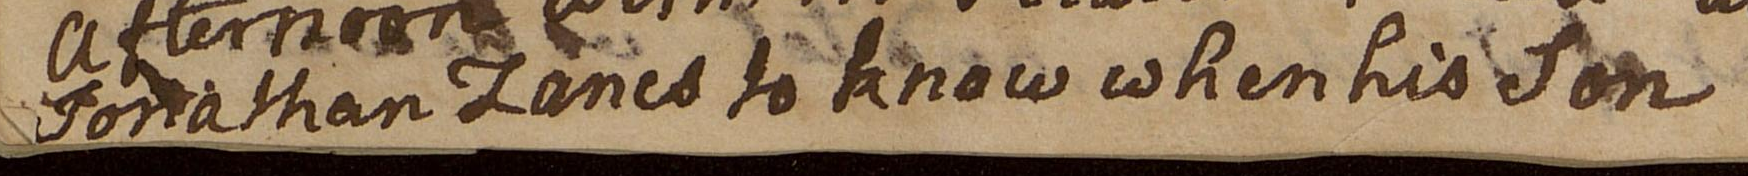Jonathan Lanes to know when his Son
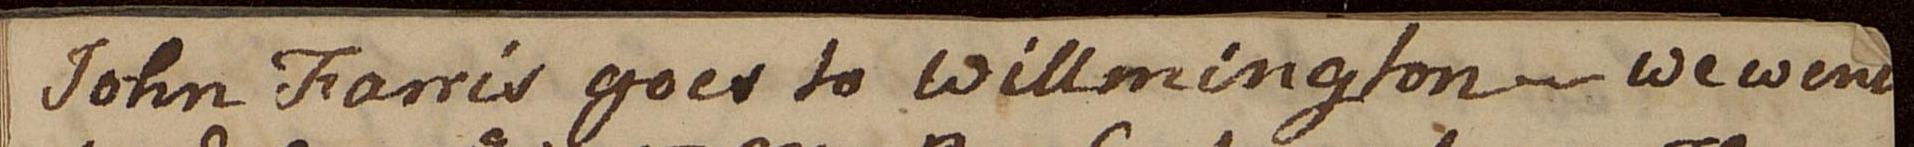John Farris goes to willmington- we went
